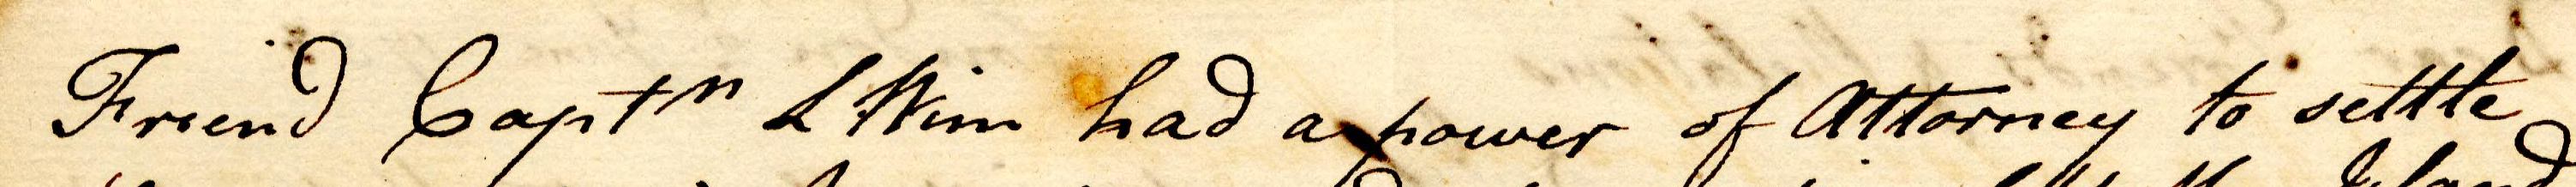Friend Capt^n. L Wim had a power of Attorney to settle,
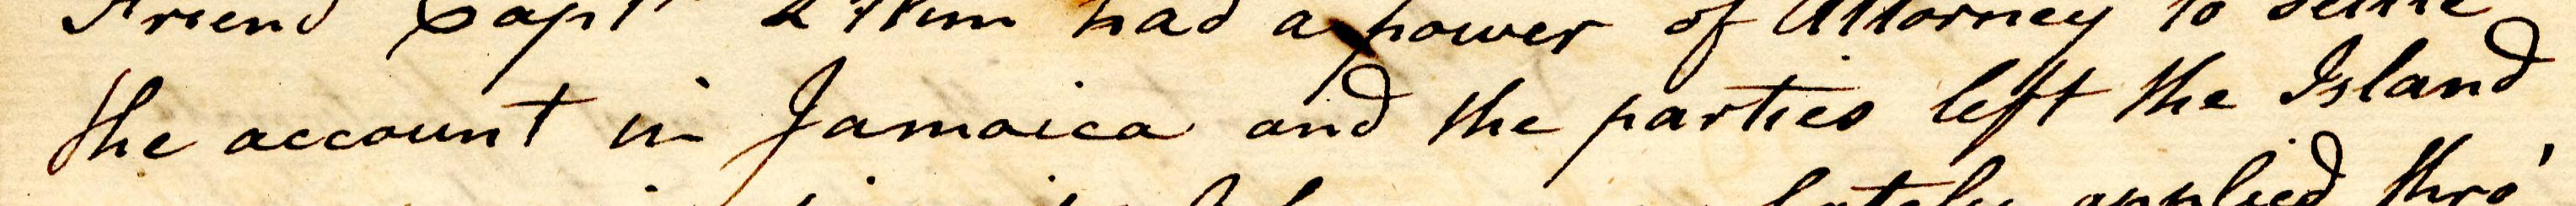the account in Jamaica and the parties left the Island
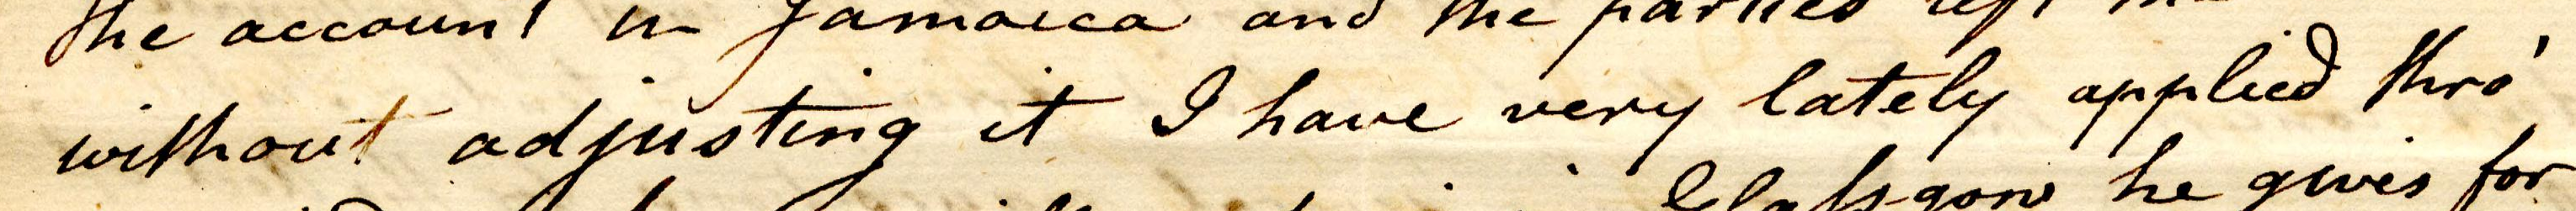without adjusting it I have very lately applied thro'
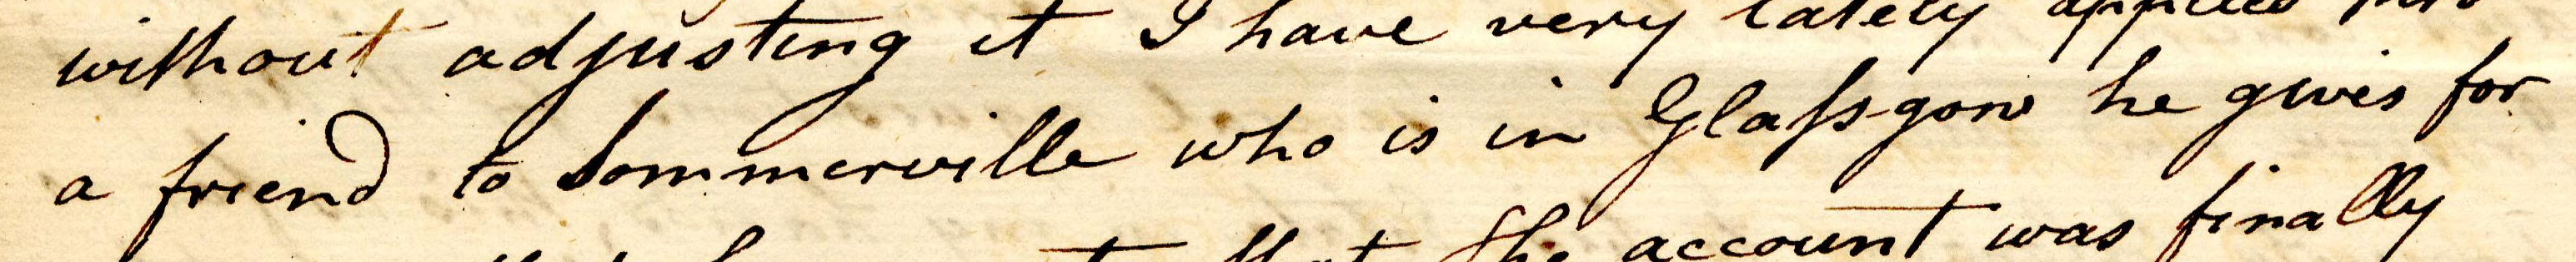a friend to Sommerville who is in Glassgow he gives for
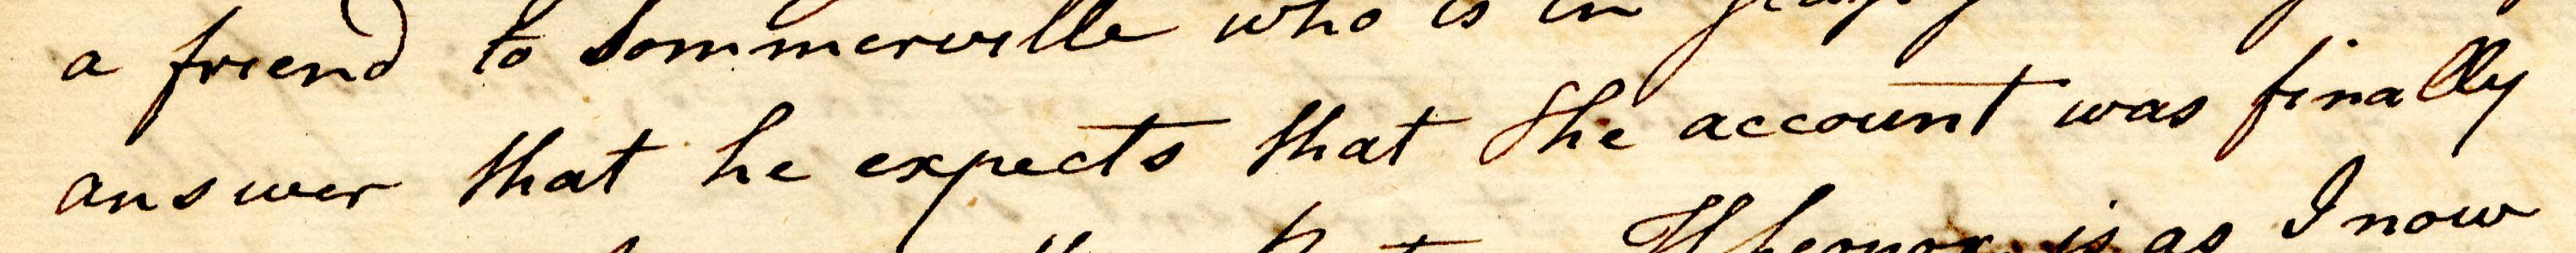answer that he expects that the account was finally
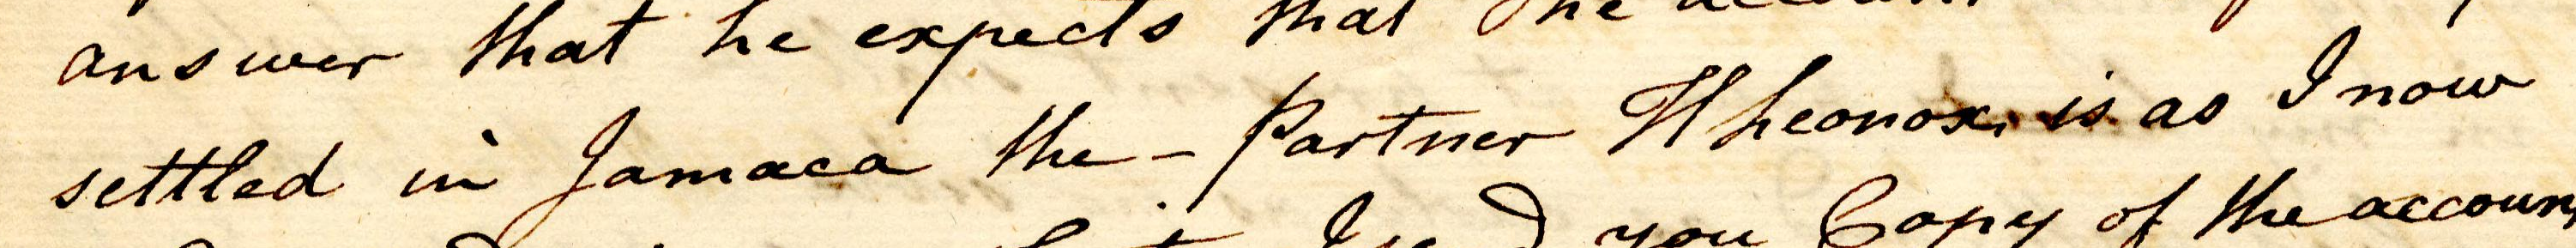settled in Jamaca the- Partner H Leonox is as I now
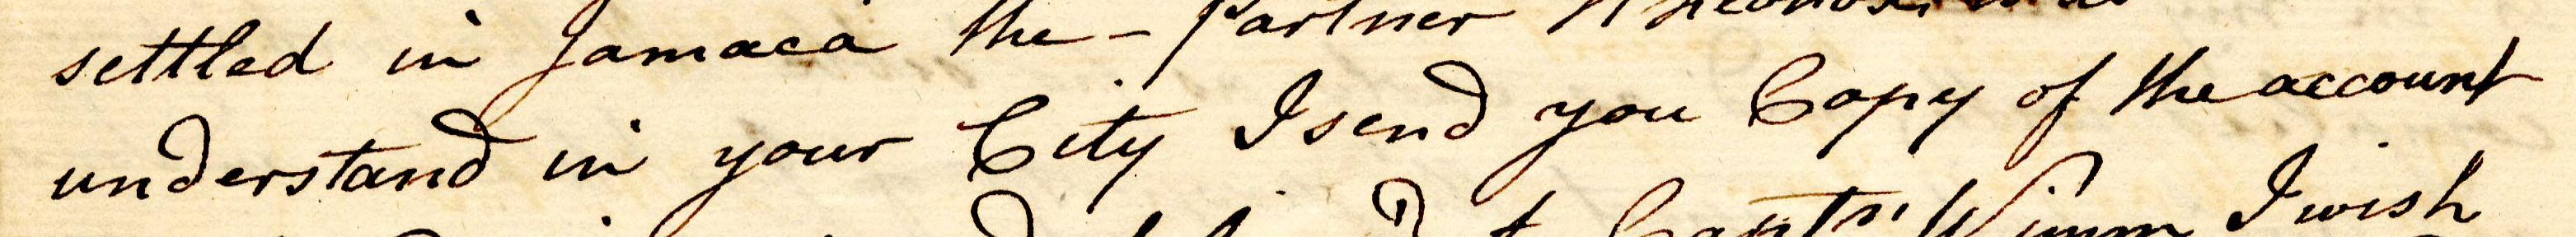understand in your City I send you Copy of the account
